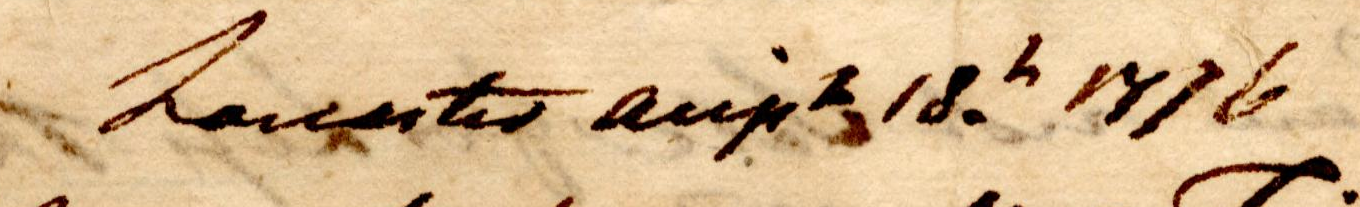Lancaster aug^t 18^h. 1776
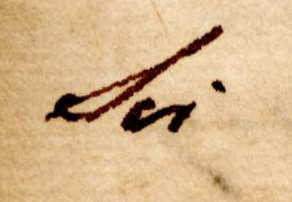Sir
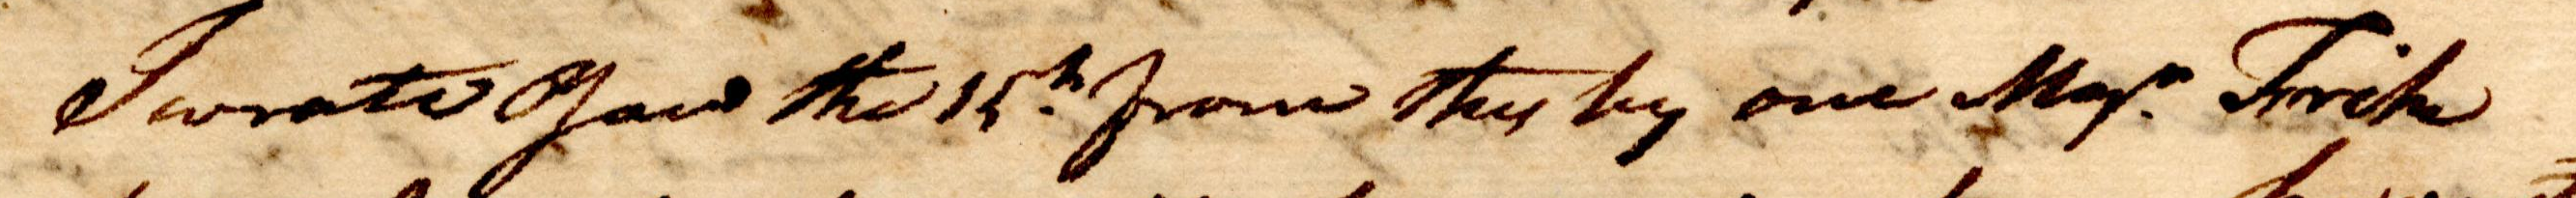I wrote you the 15^h/ from they by one Maj^r. Frick
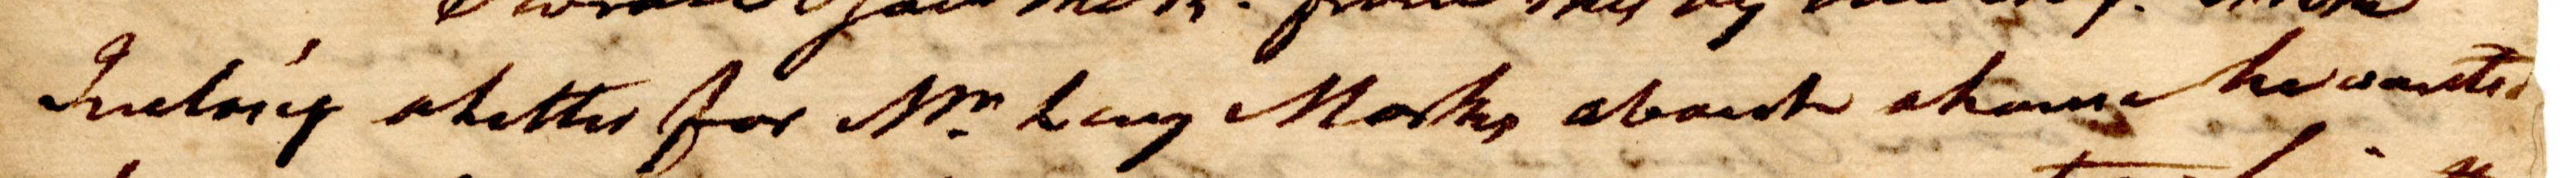Inclosing a Letter for M^r Levy Marks about a home he wanted
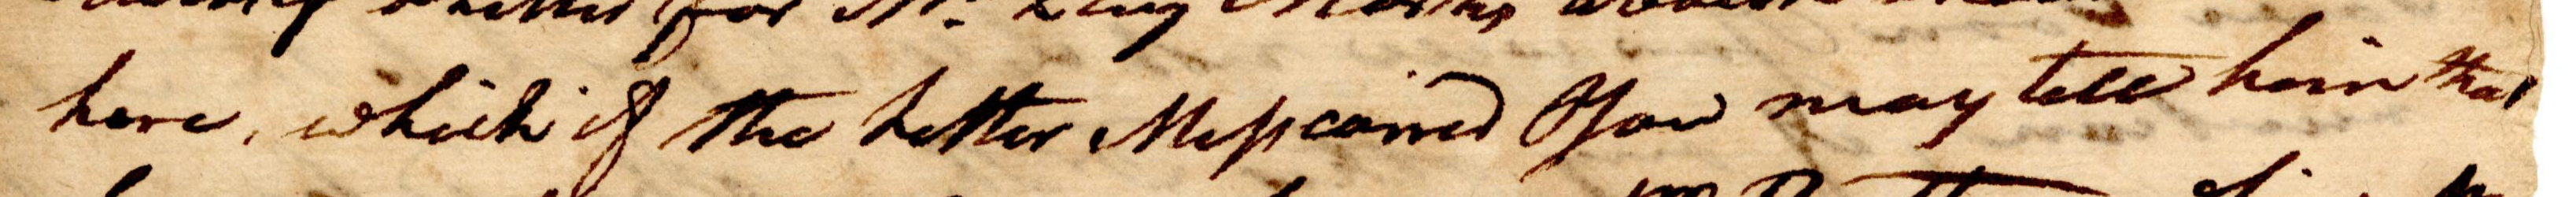here, which if the Letter Misscarred you may tell him that
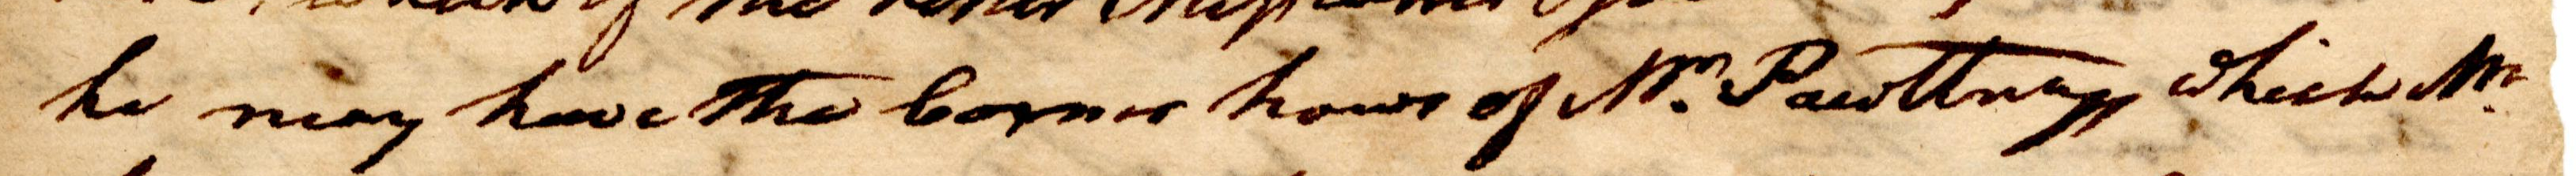he may have the Corner hows of M^r. Pauttnay which M^r
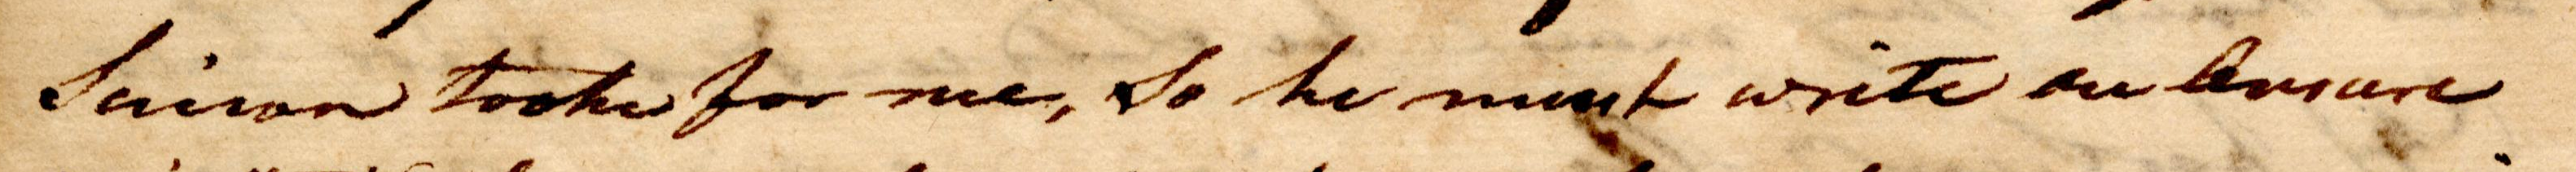Simon tooke for me so he must write see Ansure
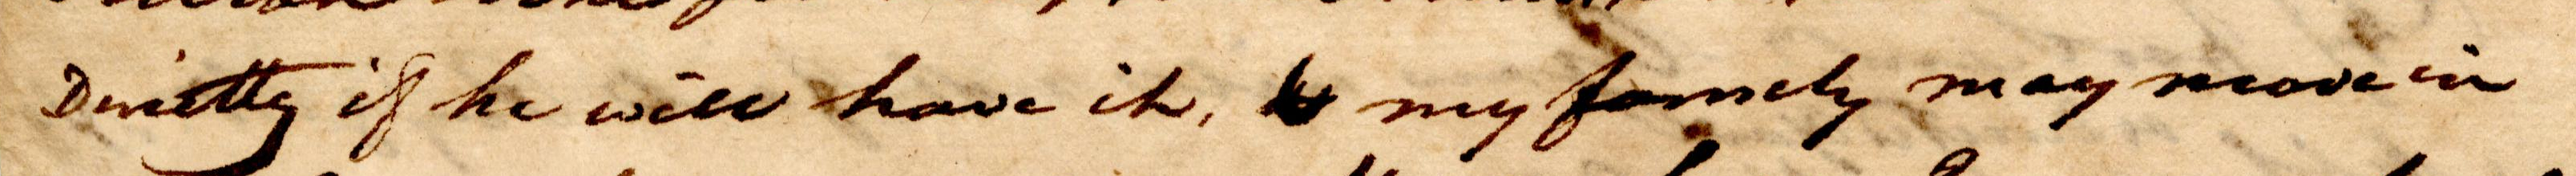Directly if he will have it, & my family may move in
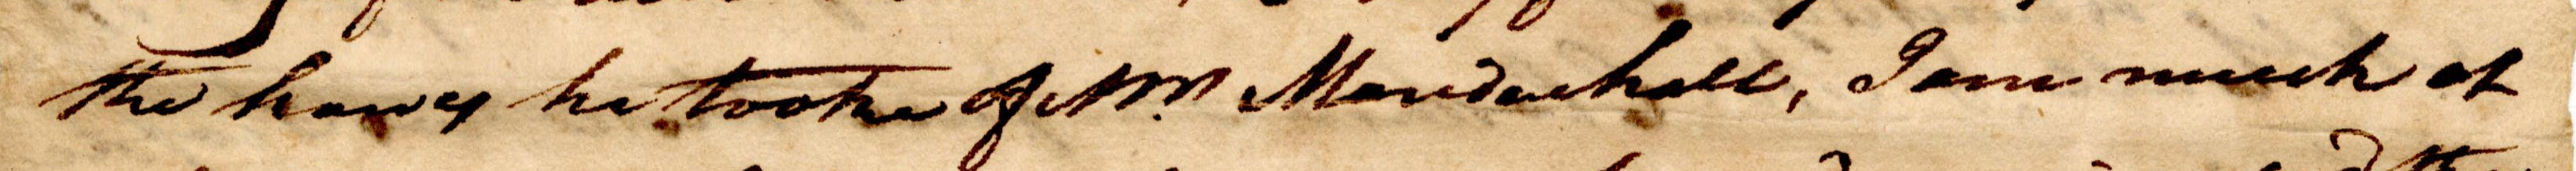the haws he tooke of M^r Mordachall, I am much of
